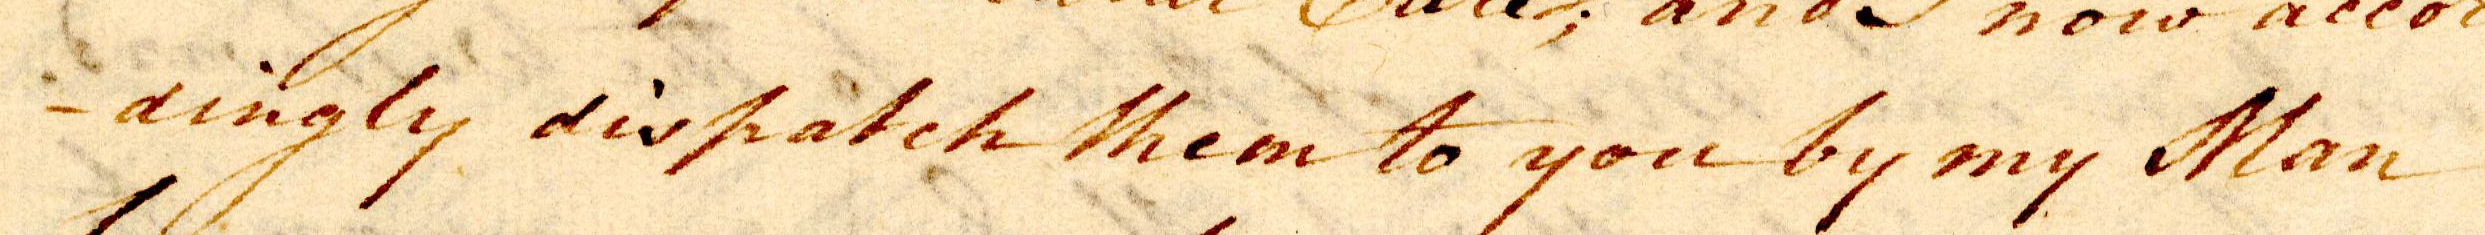-dingly dispatch them to you by my Man
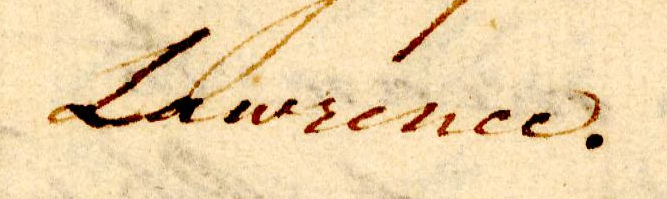Lawrence.
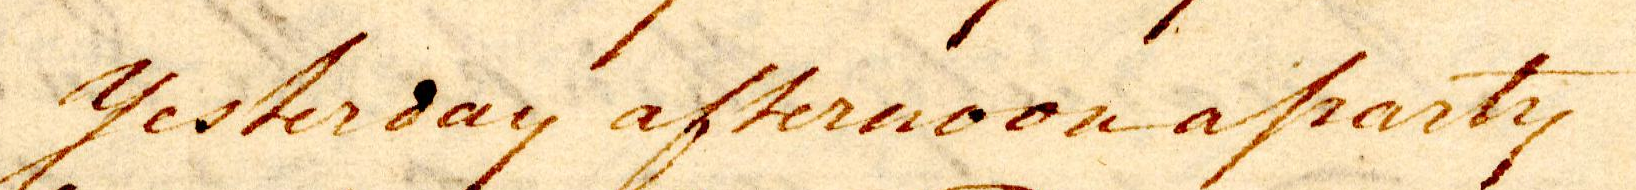Yesterday afternoon a party
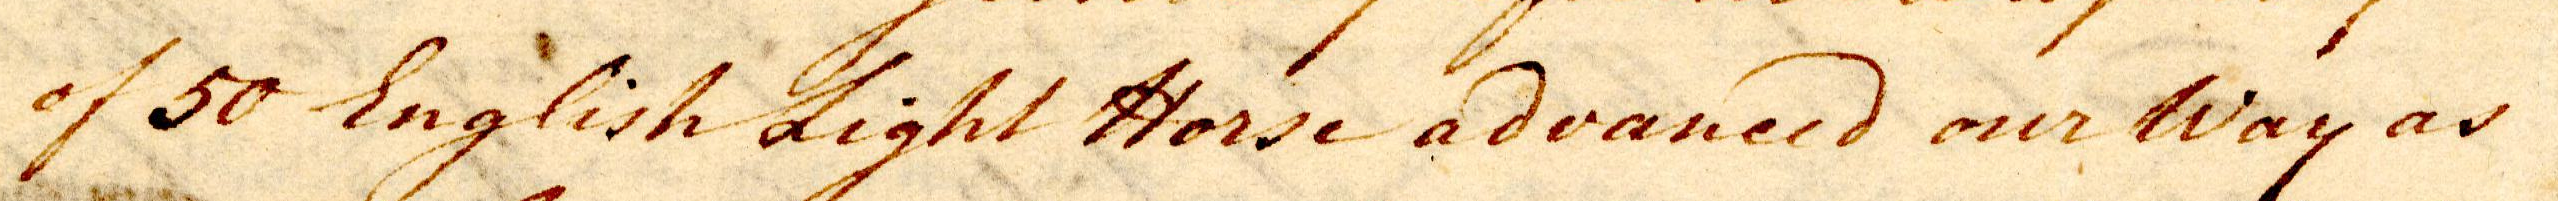of 50 English Light Horse advanced our Way as
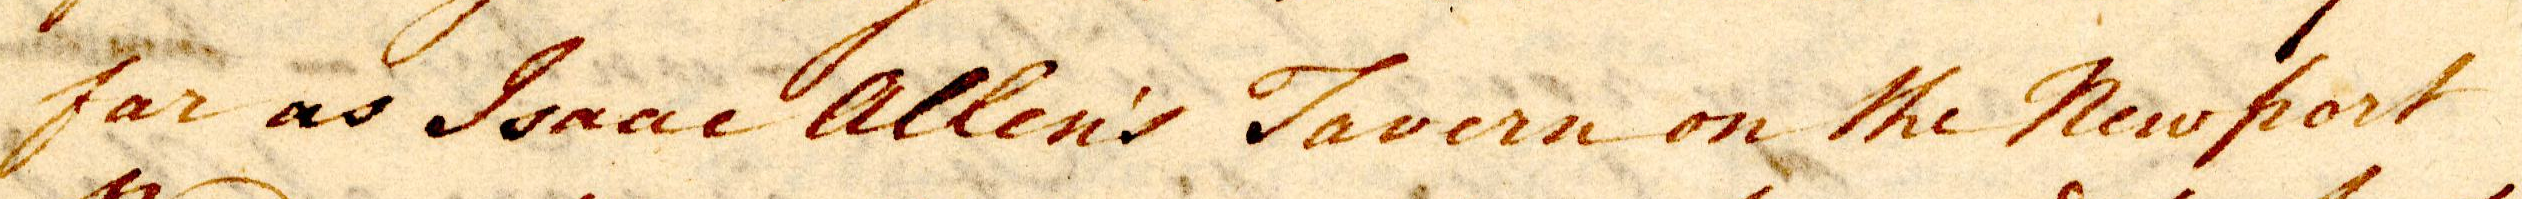far as Isaac Allen's Tavern on the Newport
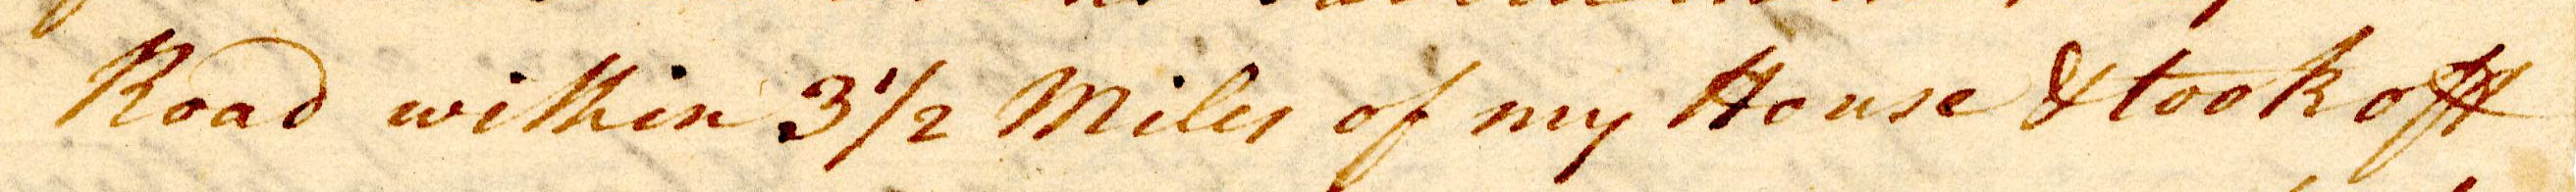Road within 3 1/2 Miles of my House & took off
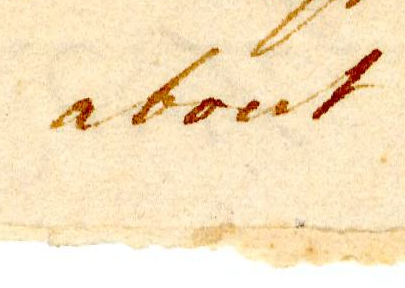about
